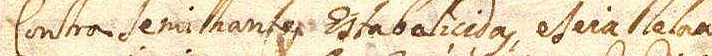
Contra semilhantes Estabaliçidas, e seia Relaxa
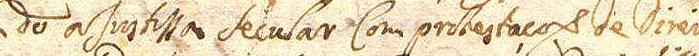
do a Justissa Secular Com protestaçaõ de Direit_
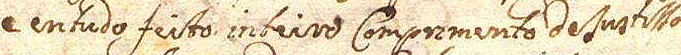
e en tudo feito inteiro Comprimento de Iustissa
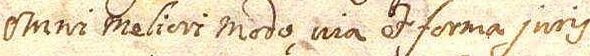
omni meliori modo, uia et forma juris
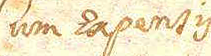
Cum Expensis
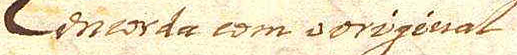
Concorda com o original
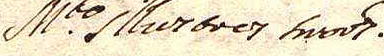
Mto. Illustres snores̄.
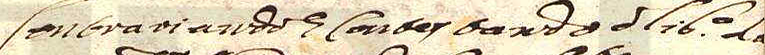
Contrariando E Contestando o lib.o da
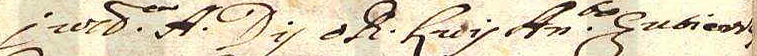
just.a A. Dis o R. Luis Anto. Gutierr__
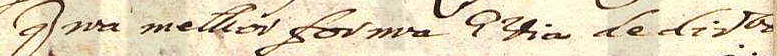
q̄ na melhor forma E Via de dir.to
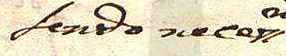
sendo necess.rio
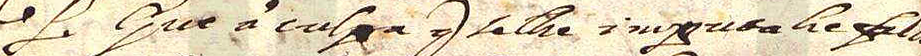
P. Que á culpa q̄ se lhe imputa he fals_
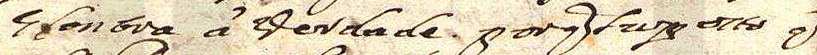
E Contra á Verdade, porq̄ suposto q̄
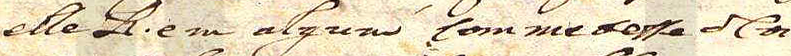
elle R. em alguns commetesse o Cri
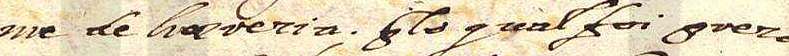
me de h_rezia; p̄lo qual foi prezo
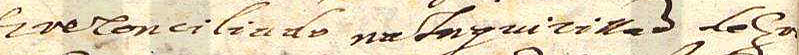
E reconciliado na Inquizissaõ de Gr_
